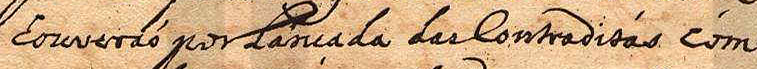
houveraõ por Lançada das Contraditas com
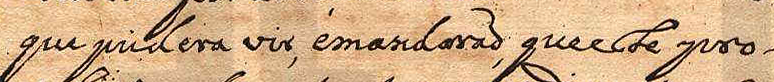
que pudera vir, e mandaraõ, que este pro
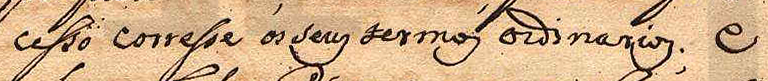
cesso corresse os seus termos ordinarios; e
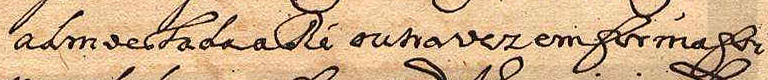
admoestada a Ré outra vez em forma foi
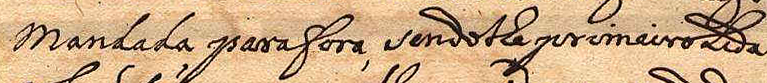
Mandada, para fora, sendolhe primeiro Lida
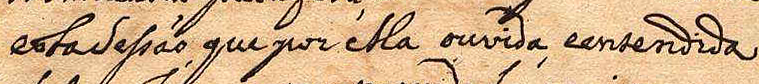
esta Sessaõ que por ella ouvida e entendida
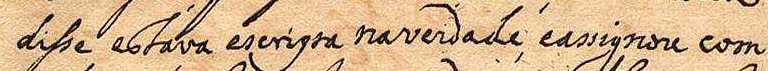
disse estava escripa na verdade, e assignou com
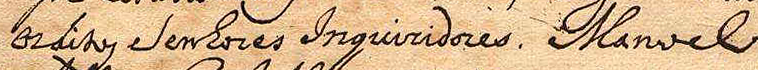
os ditos Senhores Inquizidores. Manoel
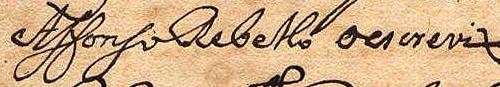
Affonso Rebello o escrevi
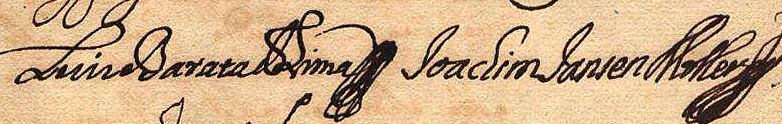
Luiz Barata d̄ Lima Ioachim Iansen Moller
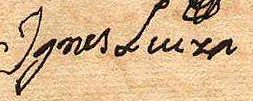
Jgnes Luiza
